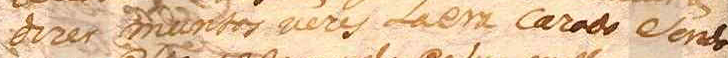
dizer muntas vezes La era cazado sendo
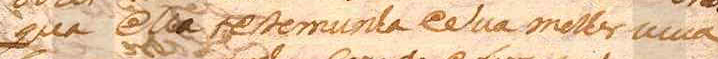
qua ella testemunha e Sua molher uiua
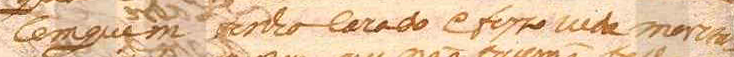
com quem tinha cazado e feyto uida marital
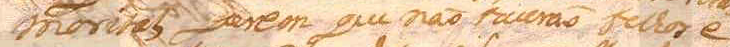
marital porem que naõ tiueraõ filhos e
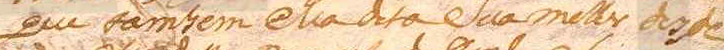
que tambem ella dita Sua molher desde
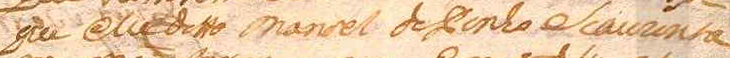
que elle ditto manoel de Pinho Se auzenta
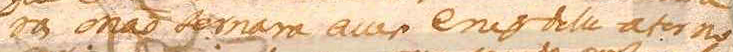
ra o naõ tornara a uer e naõ delle a ter no
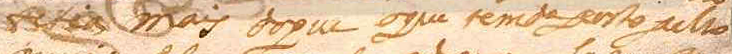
tisia mais do que o que tem deposto pello
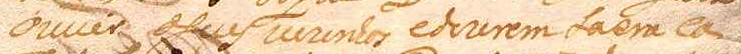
ouuir a seus uezinhos e dizerem La era ca
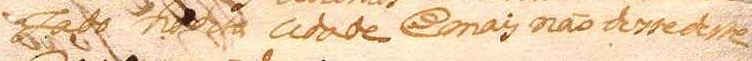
Zado na dita cidade E mais naõ disse deste
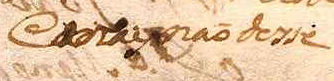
E mais naõ disse
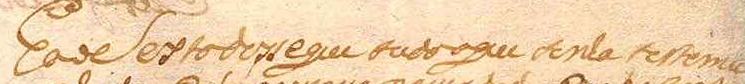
E ao Sexto disse que tudo o que tinha testemu
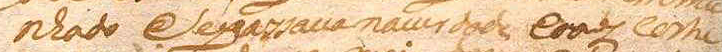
nhado Se passaua na uerdade e o aos costu
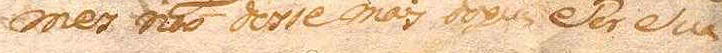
mes naõ disse mais do que Ser Sua
